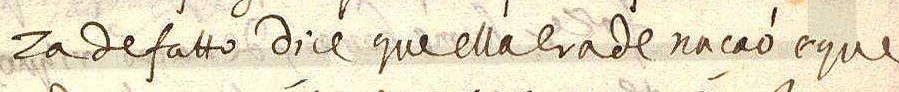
za de fatto dice que ella era de naçaõ e que
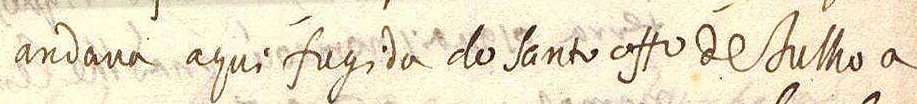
andaua aqui fugida do santo offo de Iulho a
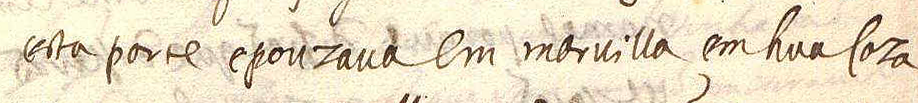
esta parte e pouzaua em maruilla em hua Caza
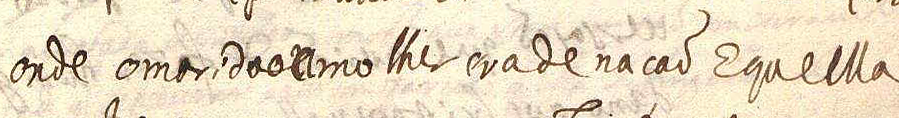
onde o marido e a molher era de naçaõ E que ella
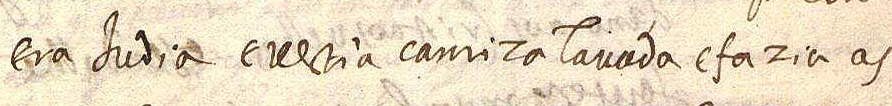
era Iudia e uestia camiza lauada e fazia as
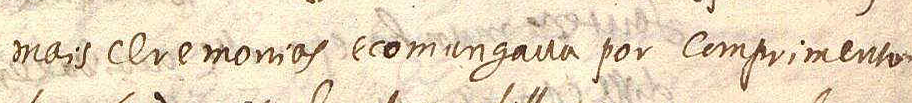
mais ceremonias e comungaua por comprimento
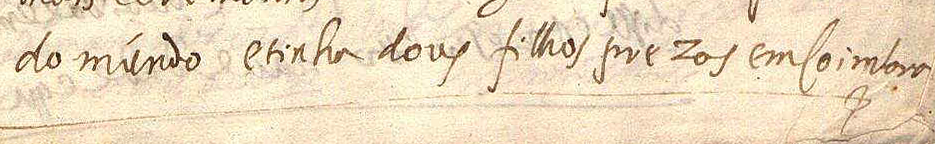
do mundo e tinha dous filhos prezos em Coimbra
